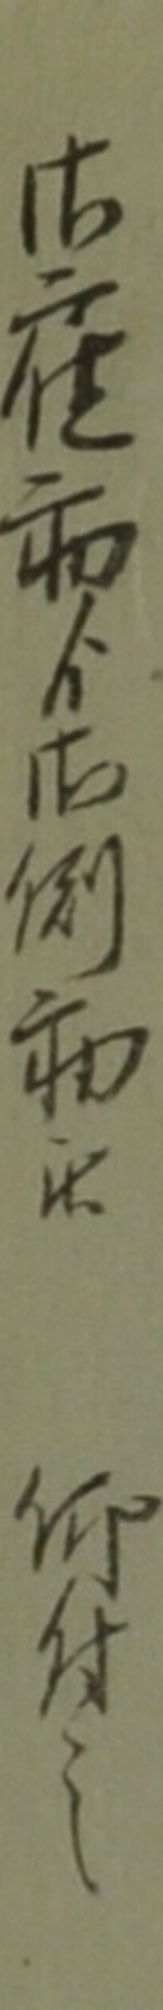御雇勤ゟ御側勤被仰付之
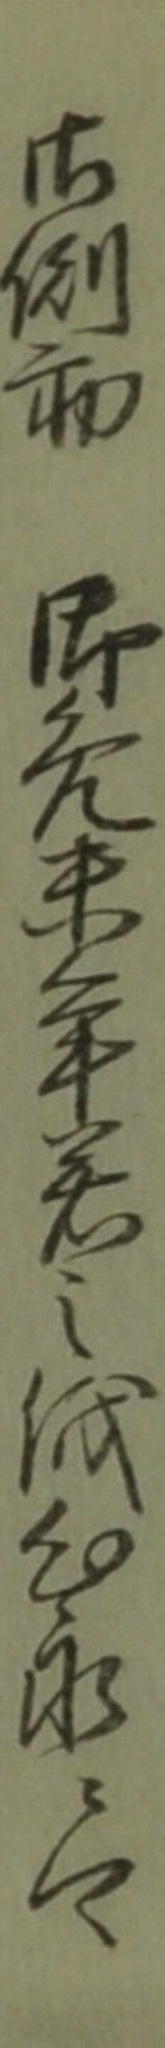御側勤御免未年若之儀心永ニ可
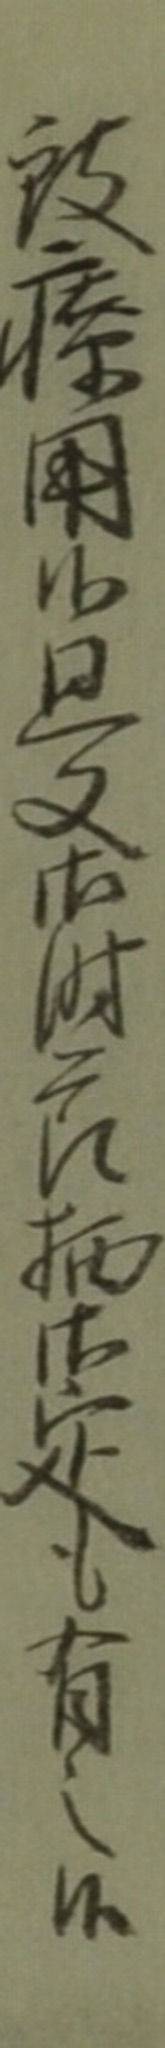致療養候且又御時節柄御定も有之候
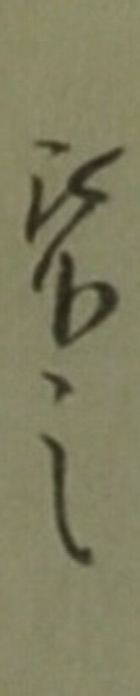被下之
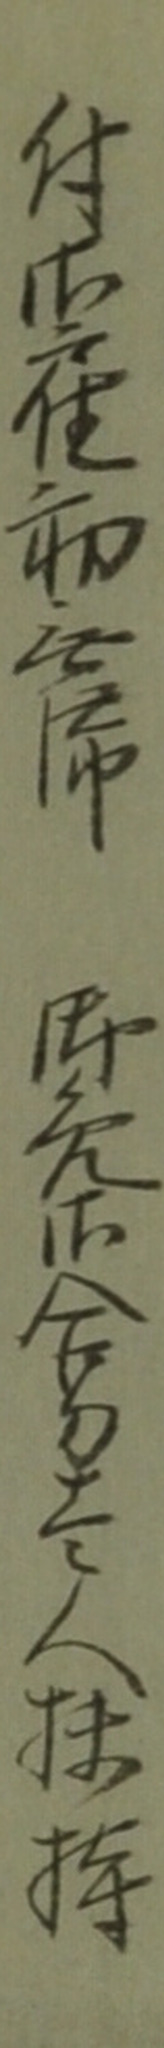付御雇勤無滞御免御合力壱人扶持
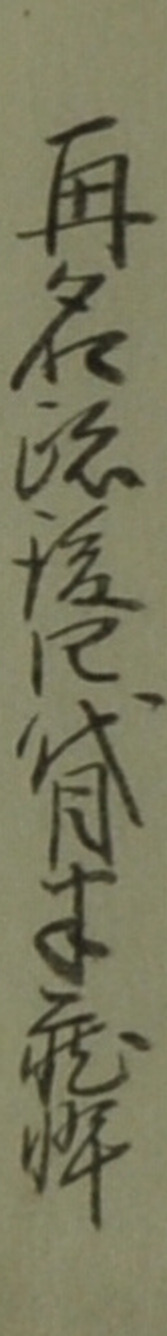再名跡後四代目半蔵忰
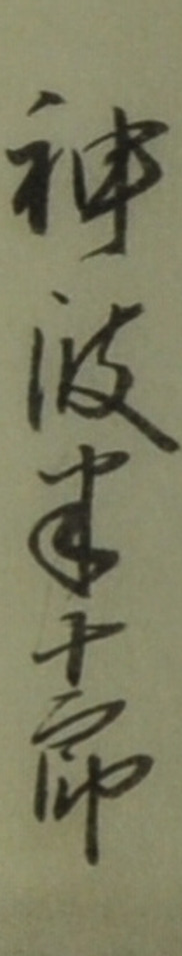神波半十郎

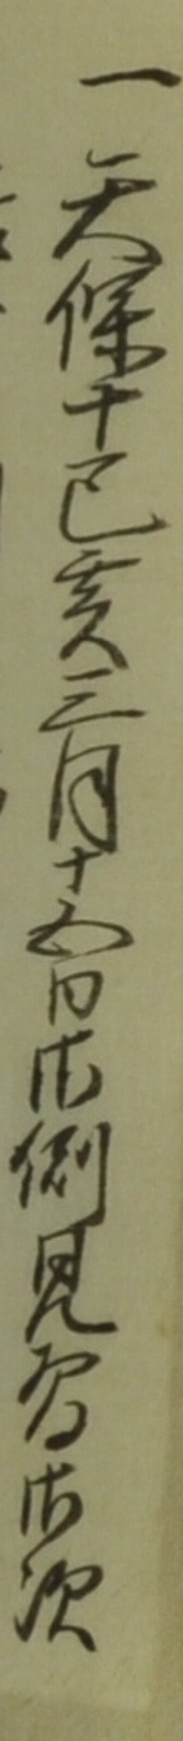一天保十己亥三月十五日御側見習御次
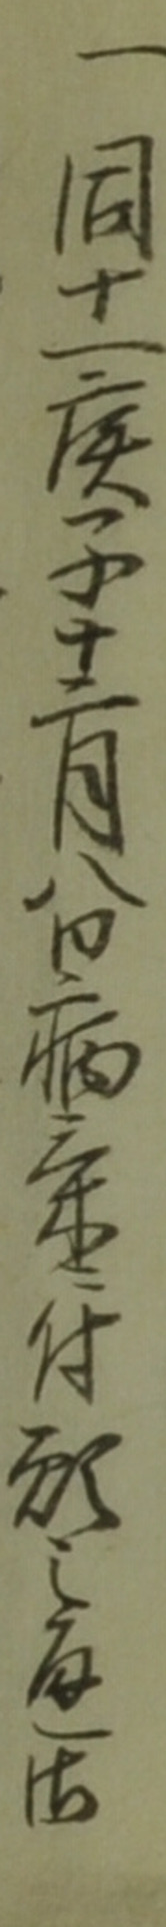一同十一庚子十二月八日病気ニ付願之通御
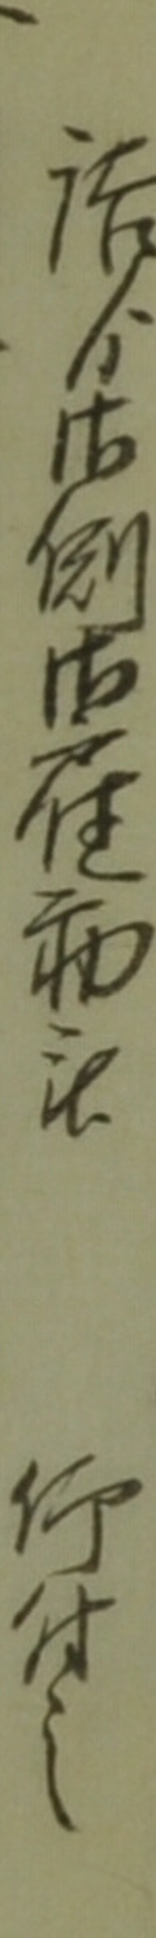詰ゟ御側御雇被仰付之
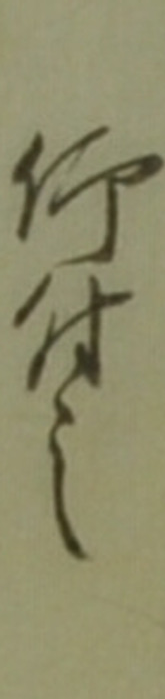仰付之
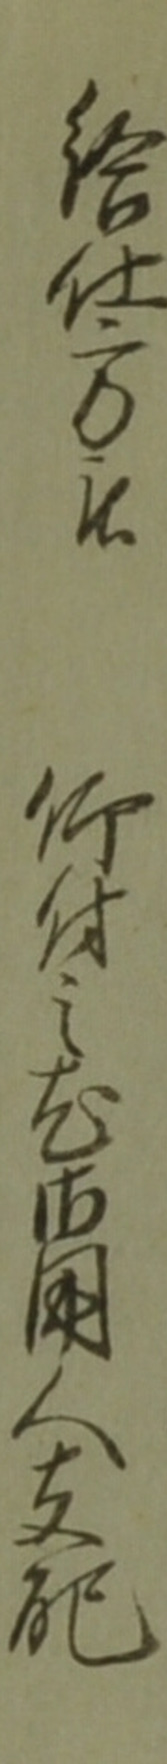給仕方被仰付之尤御用人支配
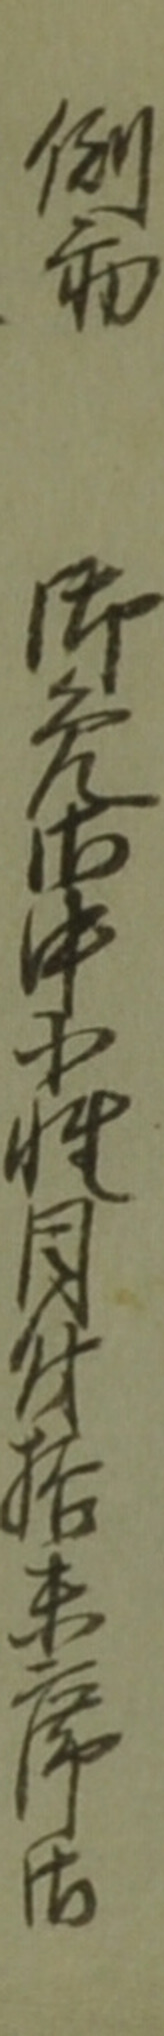側勤御免御中小性目付格末席御
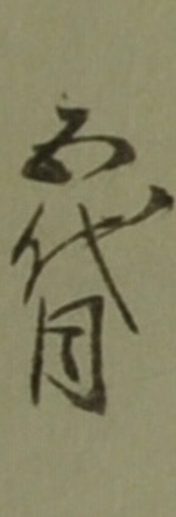五代目
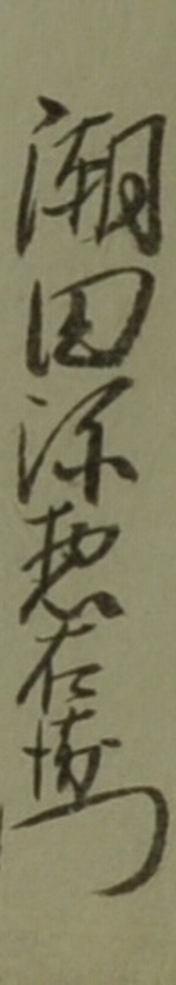潮田弥惣右衛門
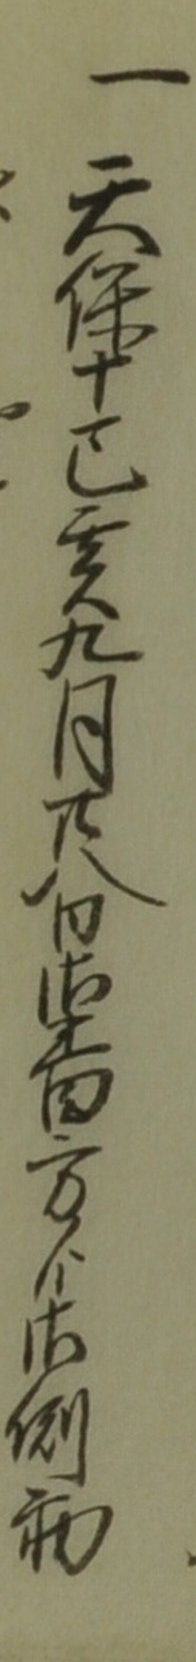一天保十己亥九月廿八日御番方ゟ御側勤
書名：諸御役代々録（五）
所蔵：伊那市立高遠町図書館・合同会社AMANE
